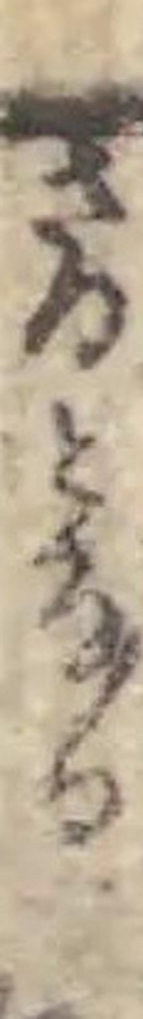さるとなる
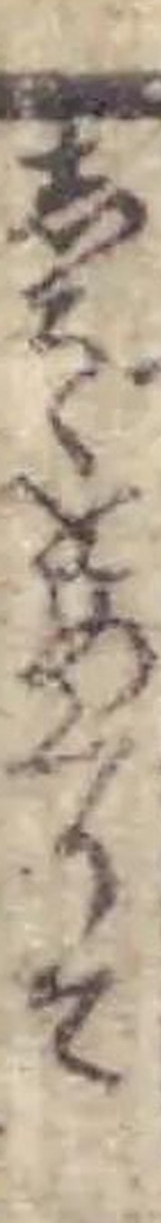しこくをめくりて
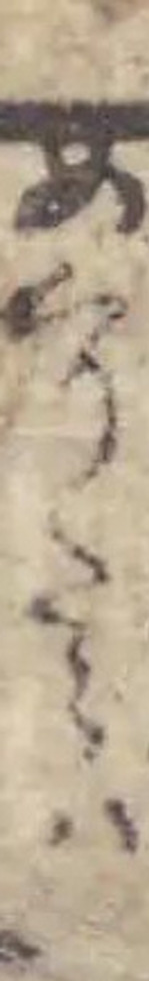めぐりたらは
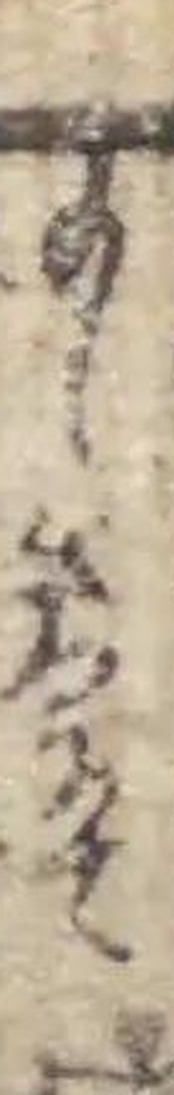もしさるにて
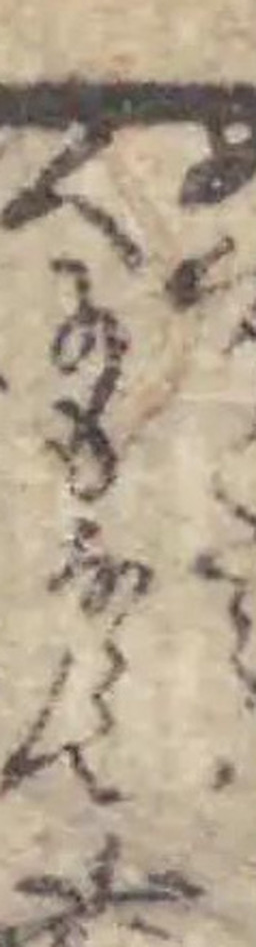人にもならん
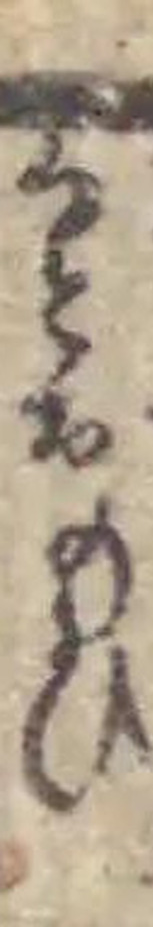かとおもひ
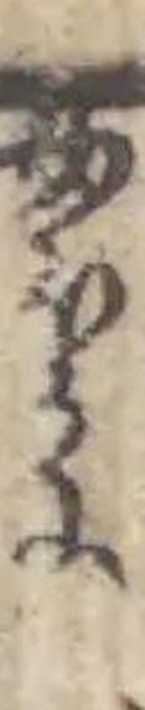女ほうに
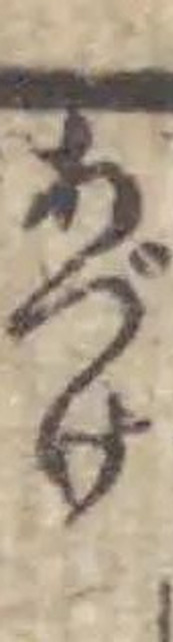あづけ
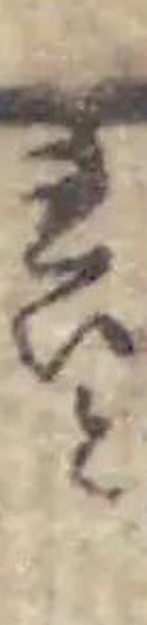れいと
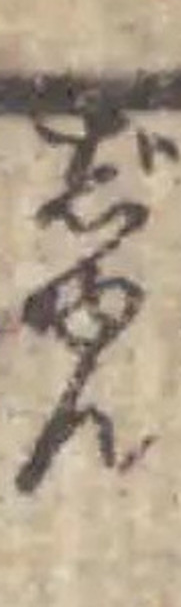じゆん
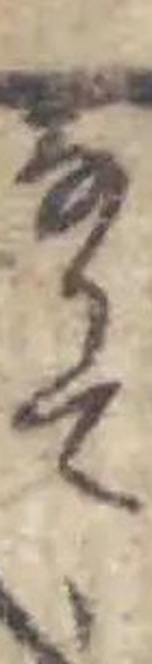なりて
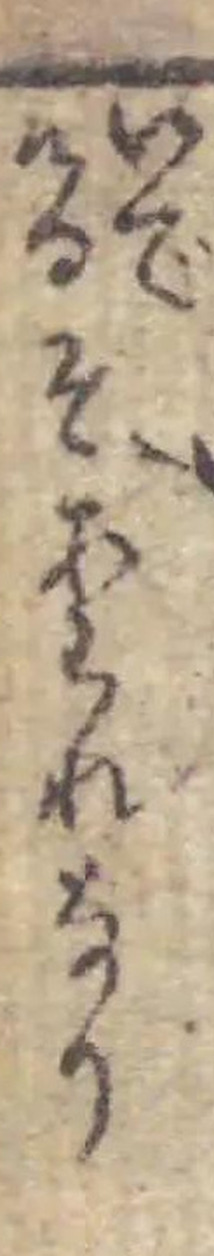けるそあわれなり

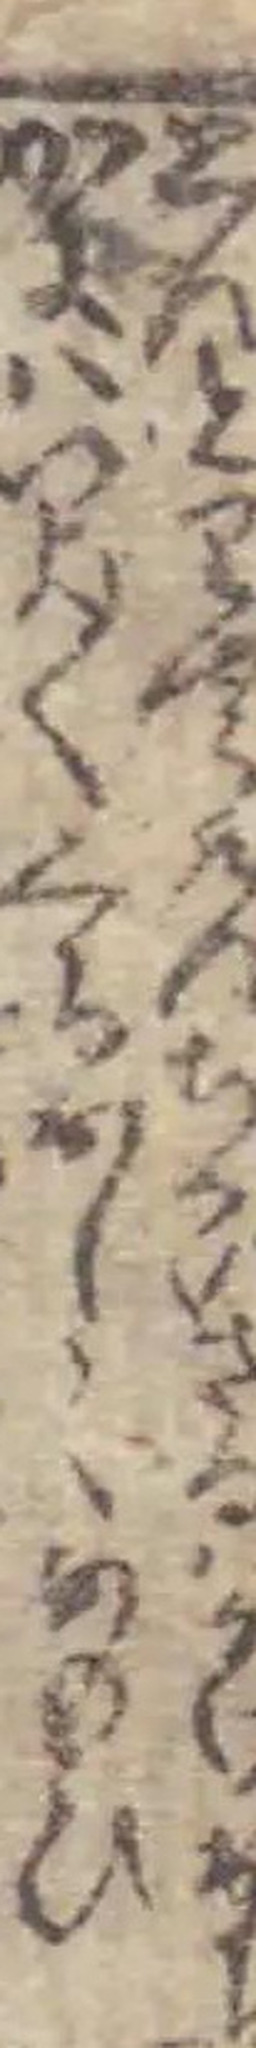かにはいよ〳〵くちおしくおもひ
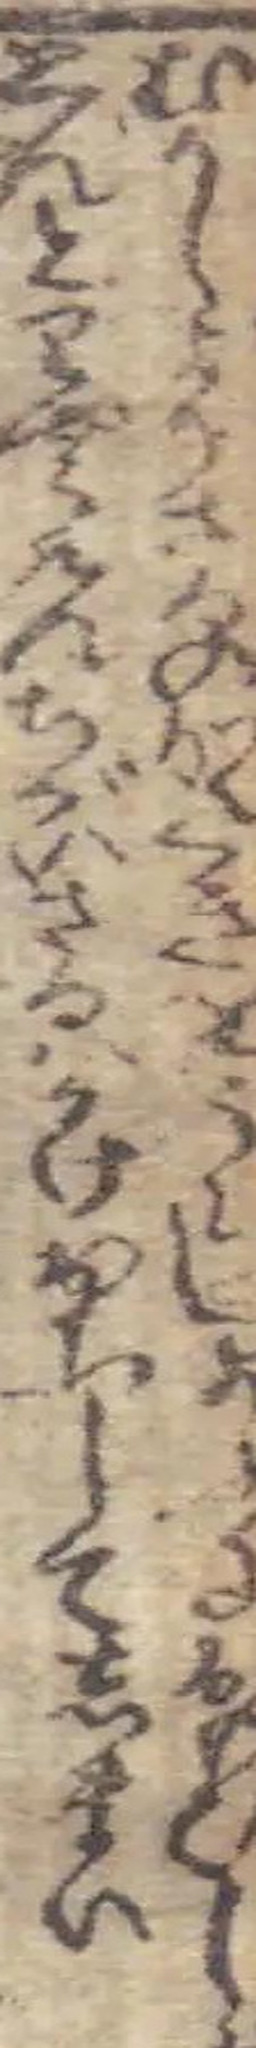とんとりやうけんちがいさるはかけおちしてしまい
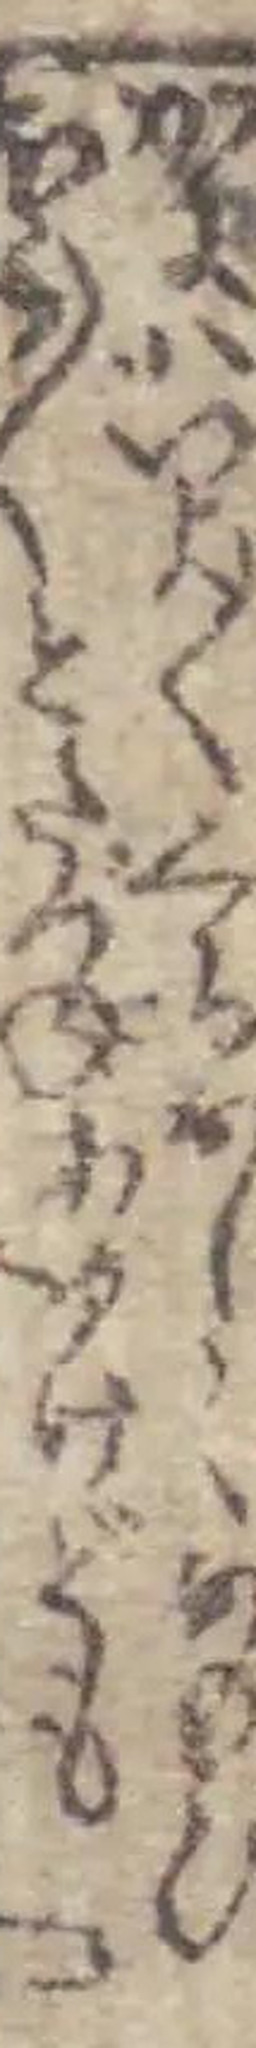ほう〴〵たづねあるけども
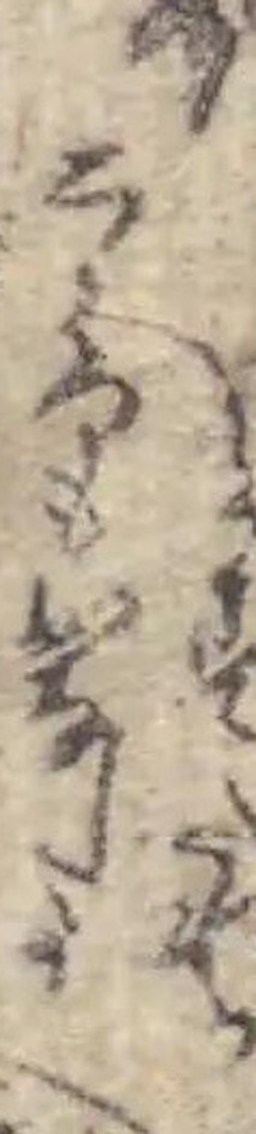こゝろもおなしに
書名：蟹牛房挟多 3巻
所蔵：国立国会図書館 National Diet Library, JAPAN
